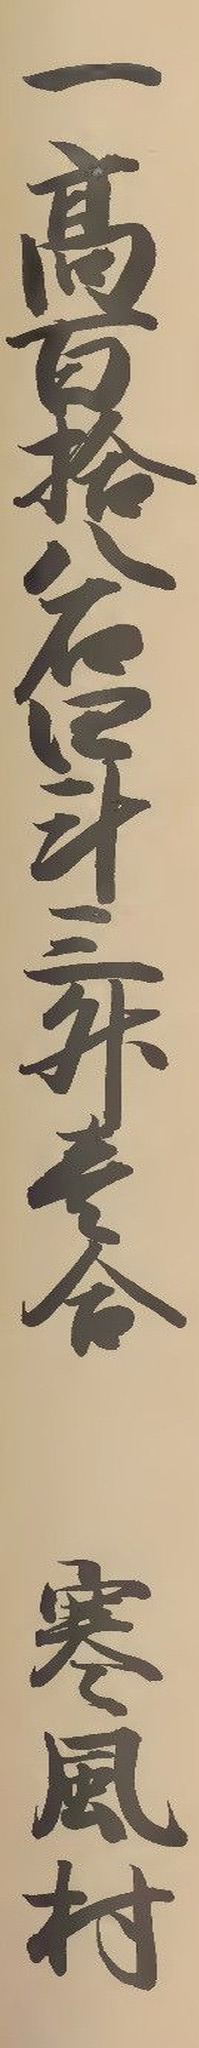一高百拾八石四斗三升壱合寒風村
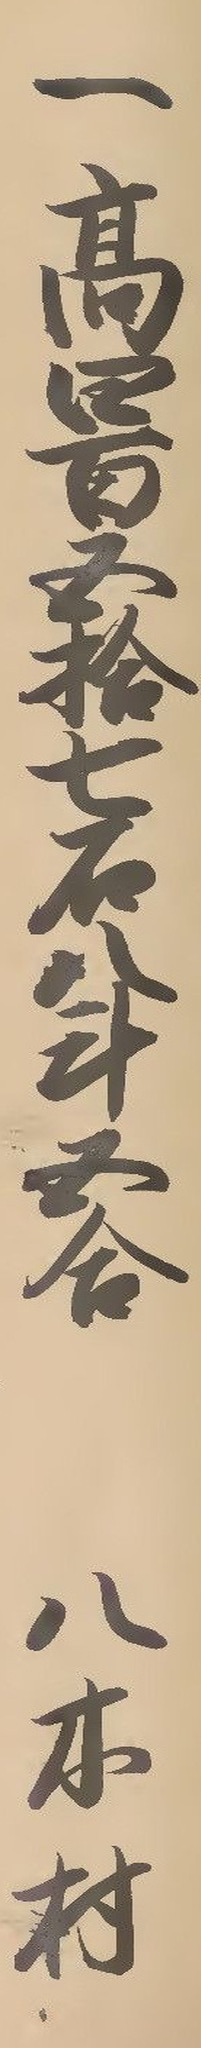一高四百五拾七石八斗五合八木村
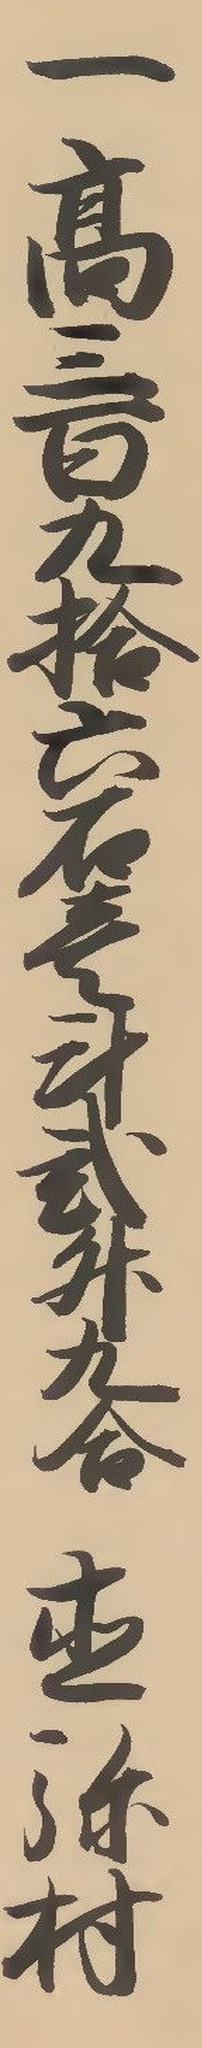一高三百九拾六石壱斗弐升九合直弥村
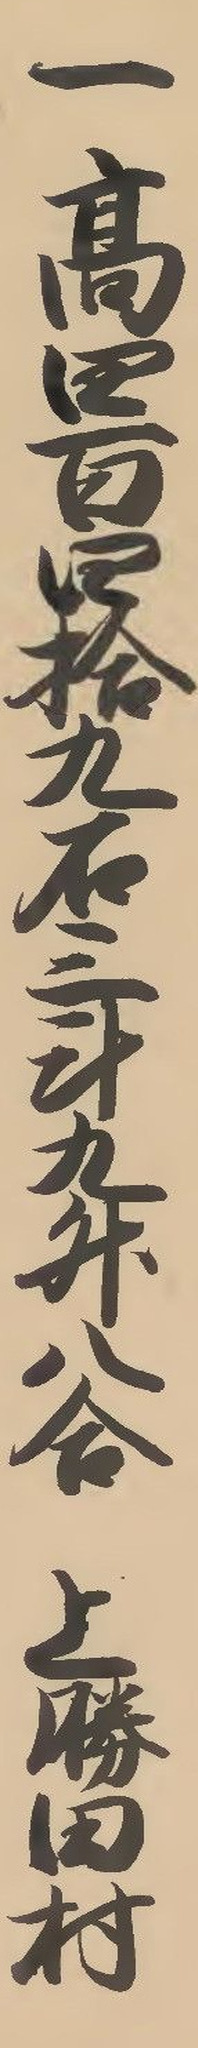一高四百四拾九石三斗九升八合上勝田村
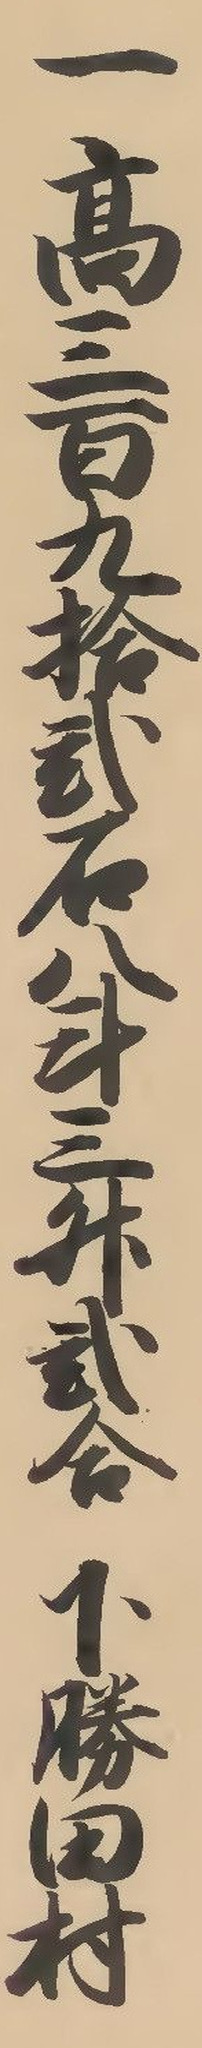一高三百九拾弐石八斗三升弐合下勝田村

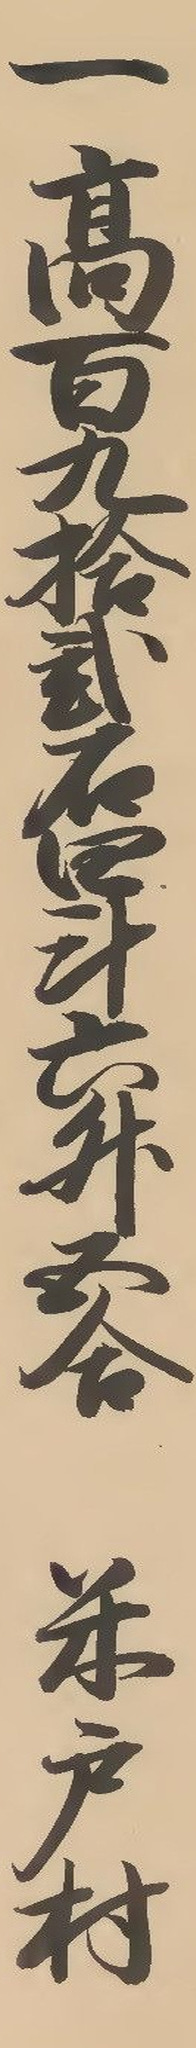一高百九拾弐石四斗六升五合米戸村
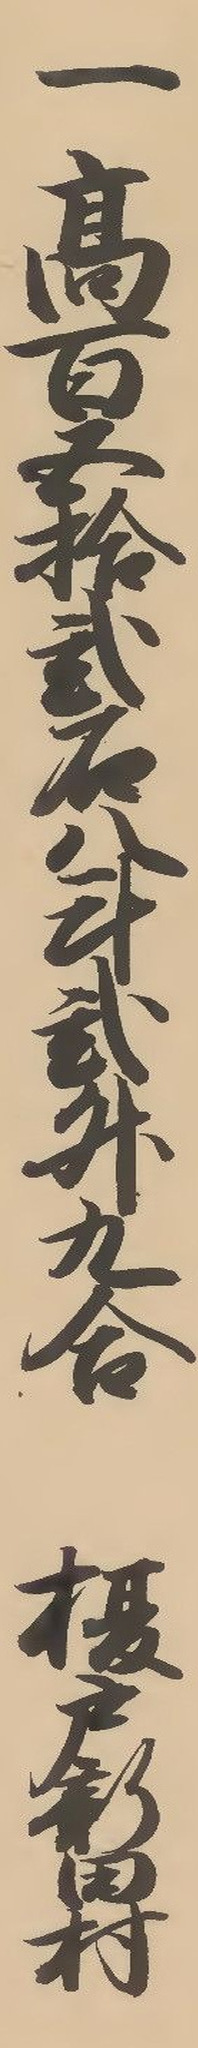一高百五拾弐石八斗弐升九合榎戸新田村
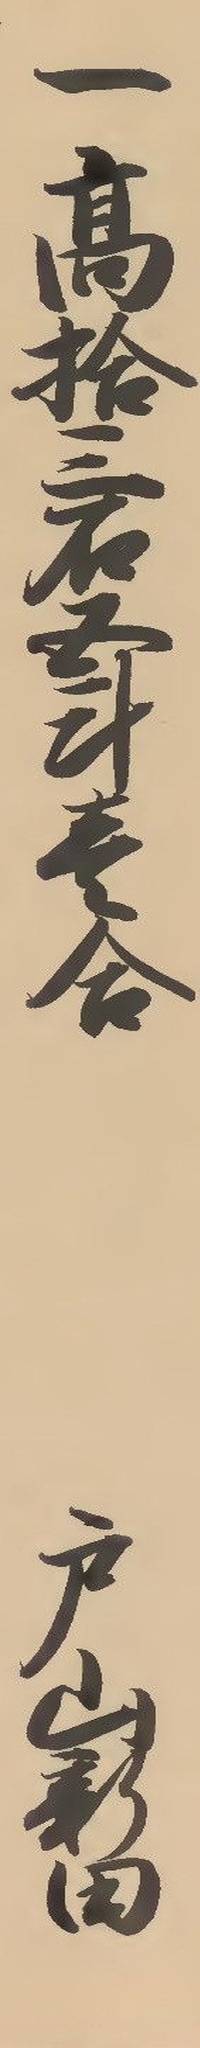一高拾三石五斗壱合戸山新田
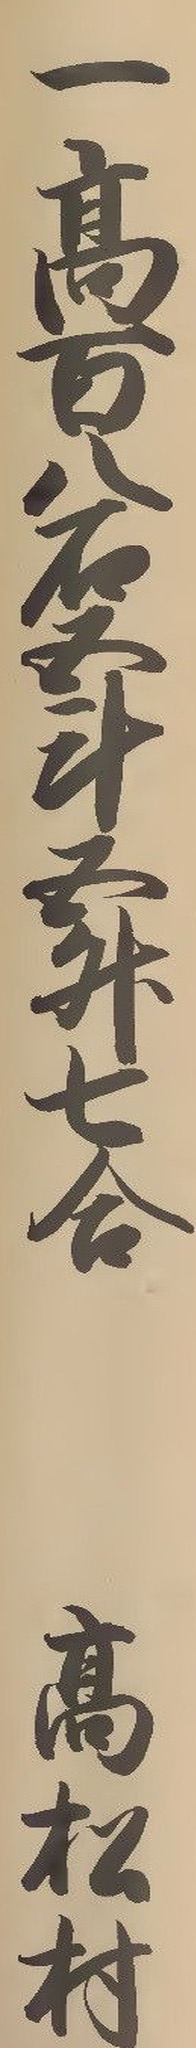一高百八石五斗五升七合高松村
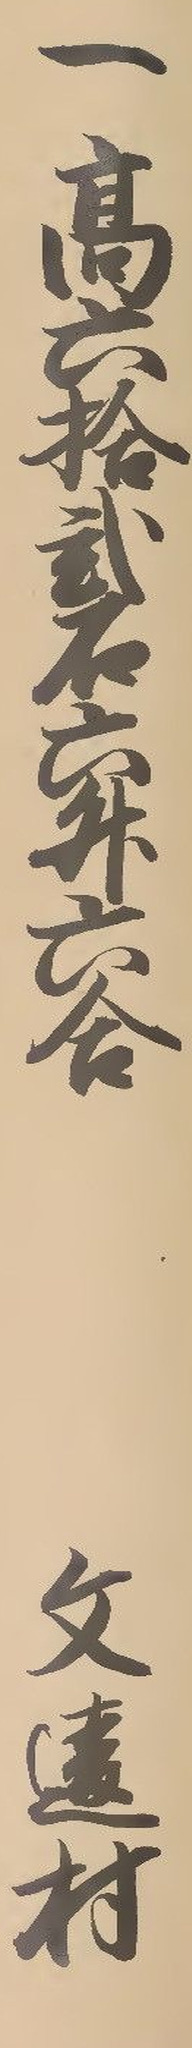一高六拾弐石六升六合文違村
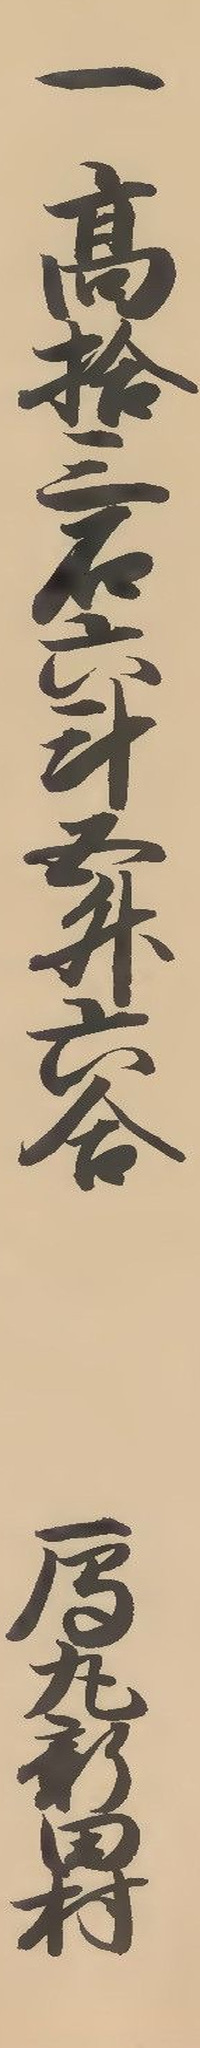一高拾三石六斗五升六合雁丸新田村
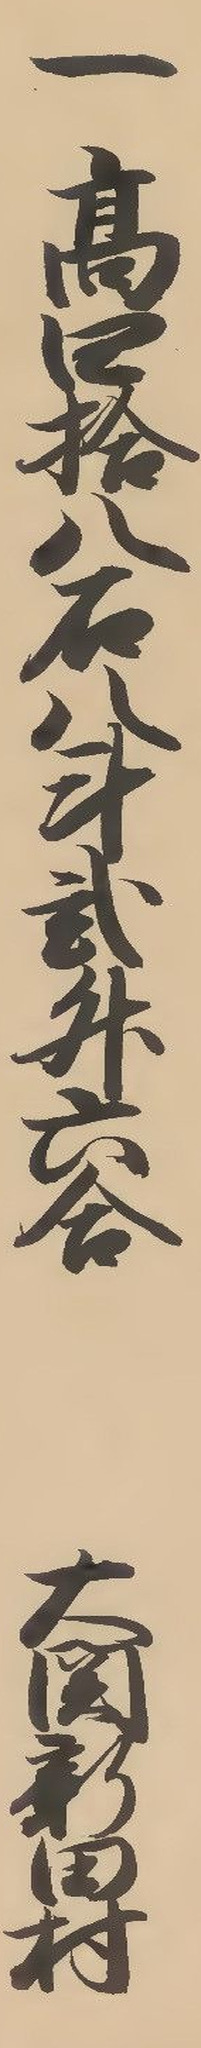一高四拾八石八斗弐升六合大関新田村
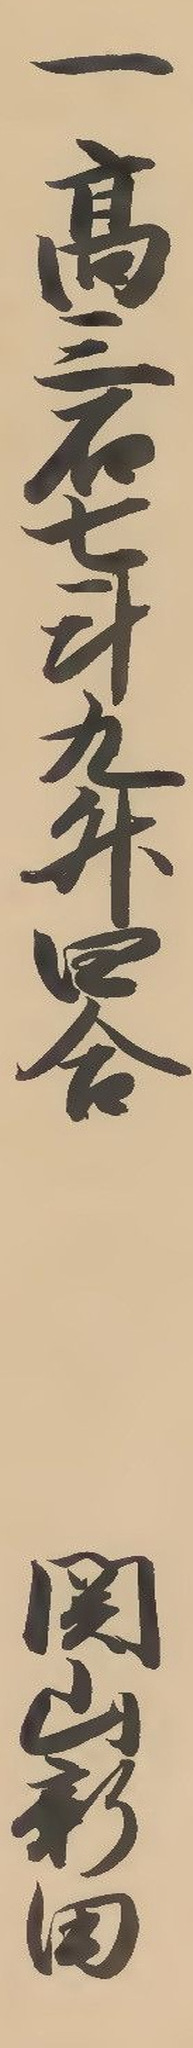一高三石七斗九升四合関山新田

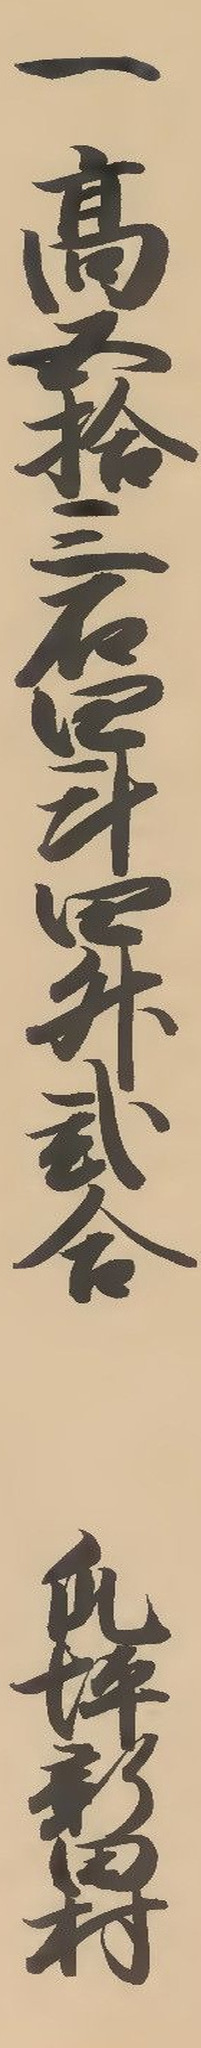一高五拾三石四斗四升弐合瓜坪新田村
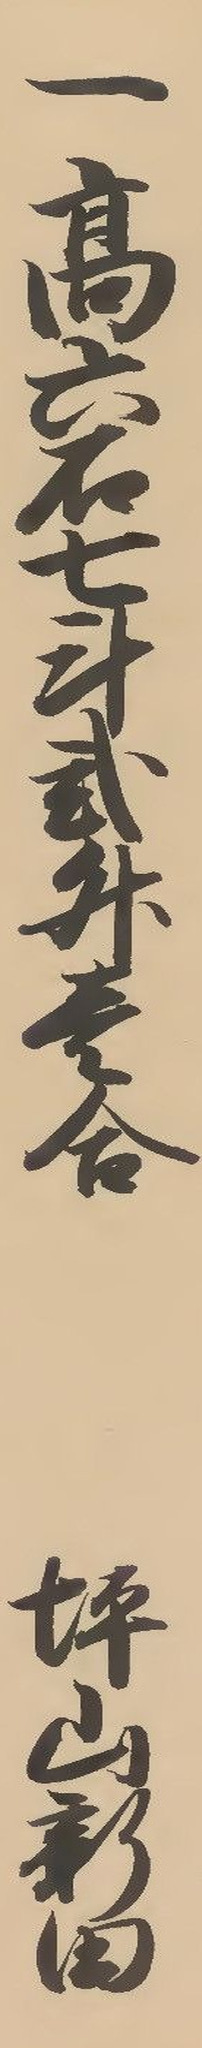一高六石七斗弐升壱合坪山新田
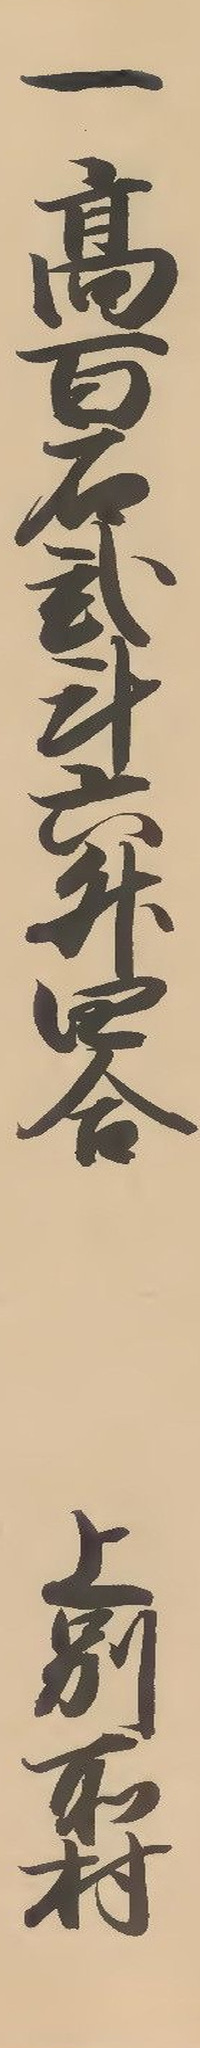一高百石弐斗六升四合上別所村
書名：下総国郷帳
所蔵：国立公文書館 National Archives of Japan
